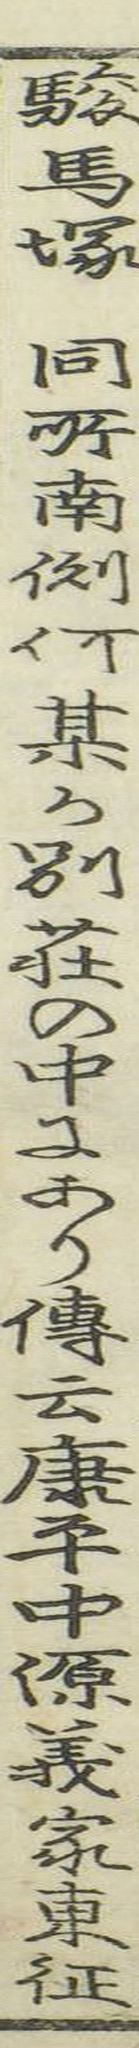駿馬塚同所南側何某か別荘の中にあり伝云康平中源義家東征

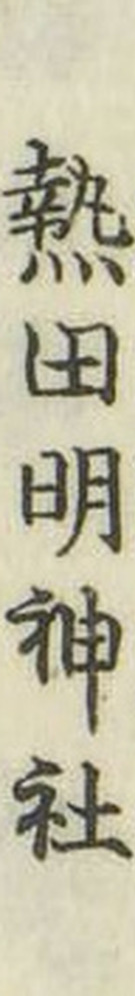熱田明神社

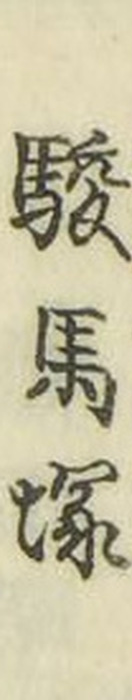駿馬塚
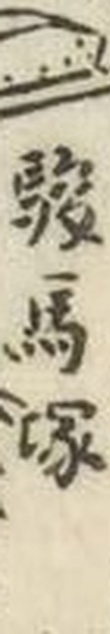駿馬塚
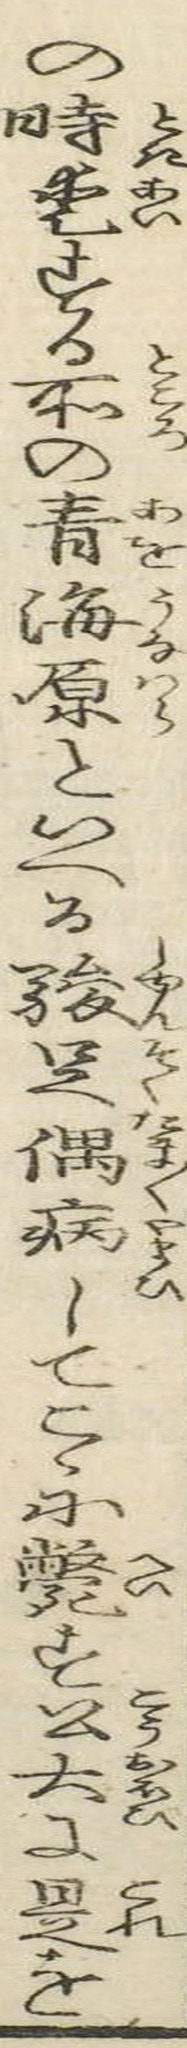の時愛する所の青海原といへる駿足偶病してこゝに斃す公大に是を
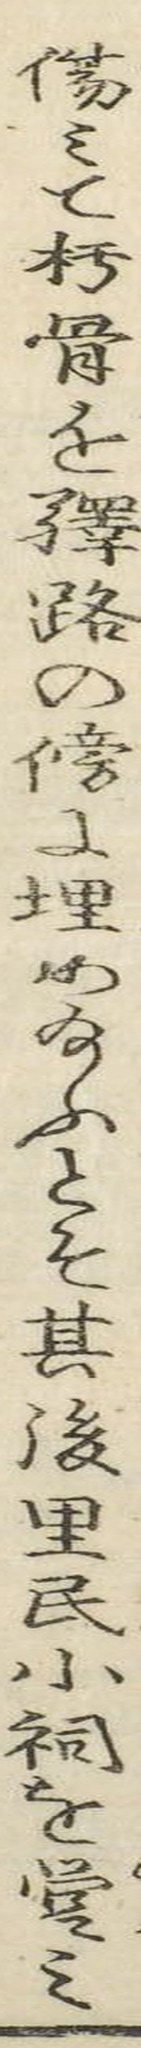傷みて朽骨を駅路の傍に埋め給ふとそ其後里民小祠を営み
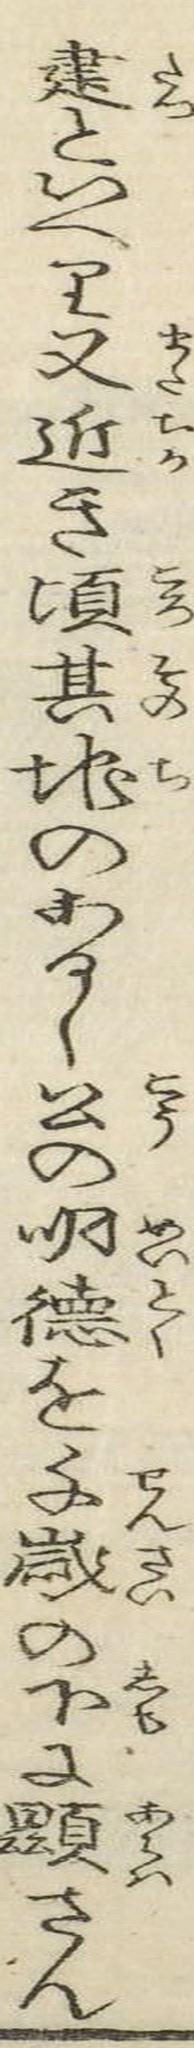建といへり又近き頃其地のあるし公の明徳を千歳の下に顕さん
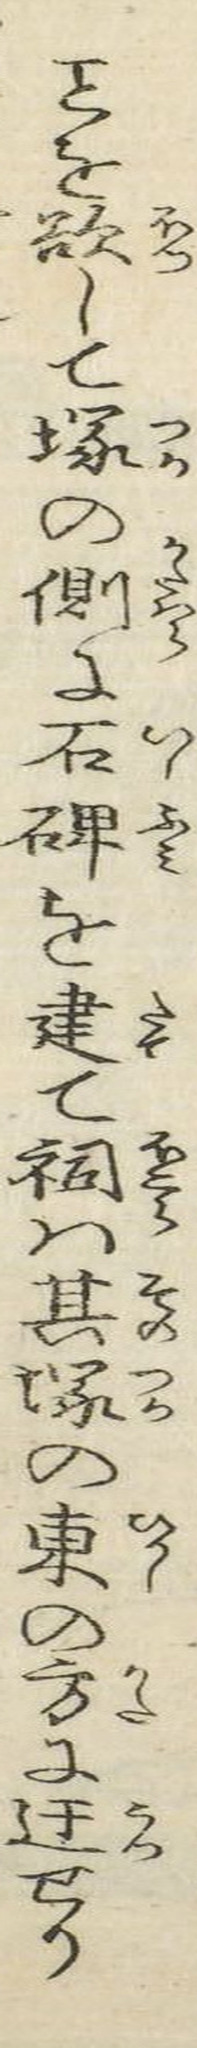ことを欲して塚の側に石碑を建て祠は其塚の東の方に遷せり
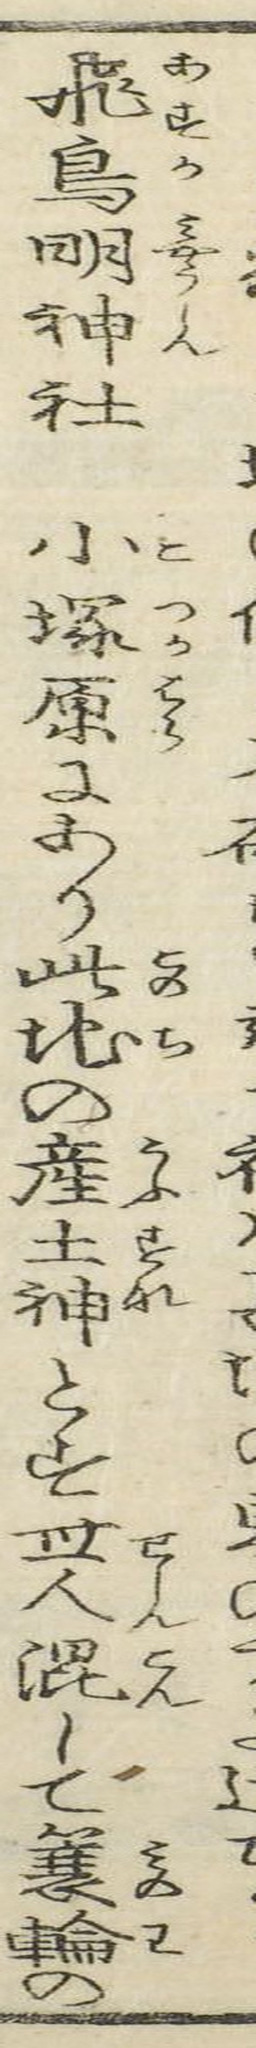飛鳥明神社小塚原にあり此地の産土神とす世人混して蓑輪の
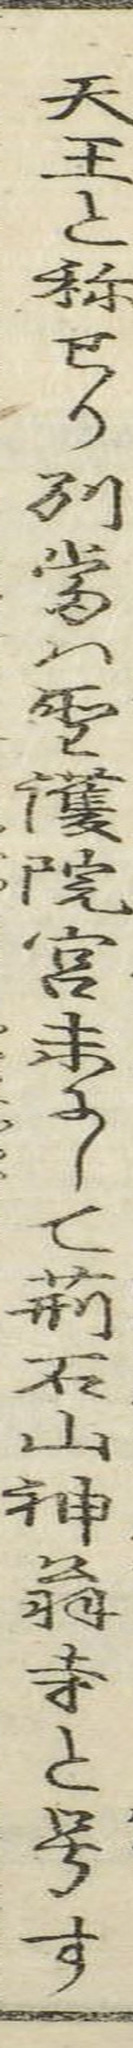天王と称せり別当は聖護院宮末にして荊石山神翁寺と号す
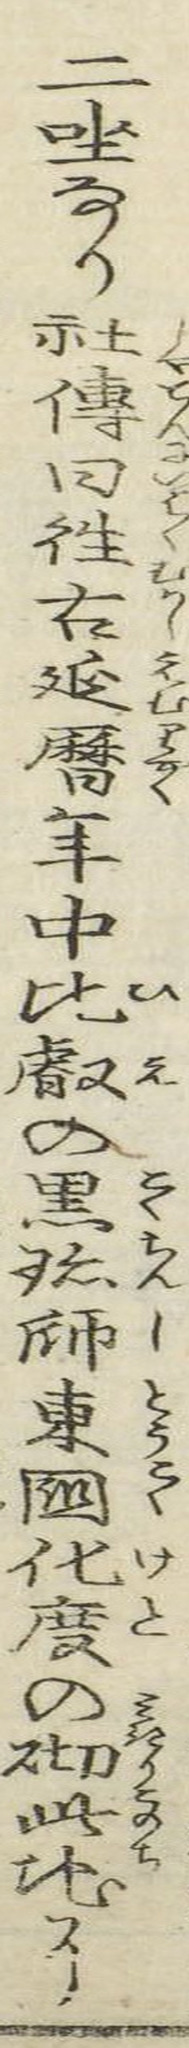二坐なり社伝曰往古延暦年中比叡の黒珍師東国化度の砌此地に
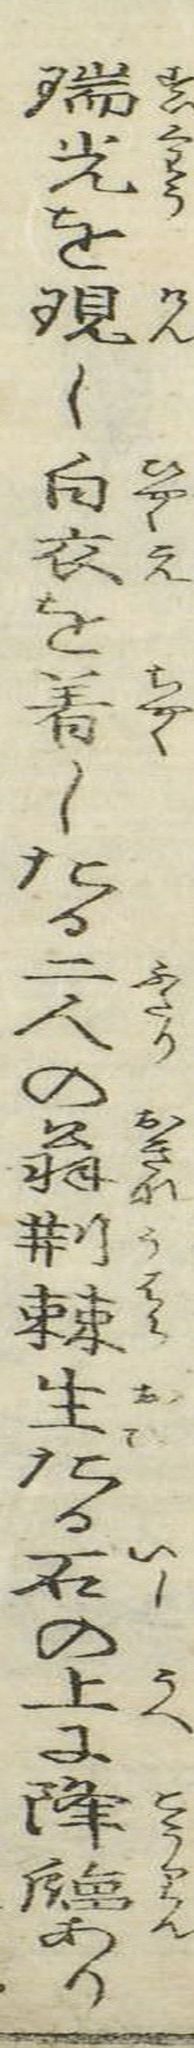瑞光を現し白衣を着したる二人の翁荊棘生たる石の上に降臨あり

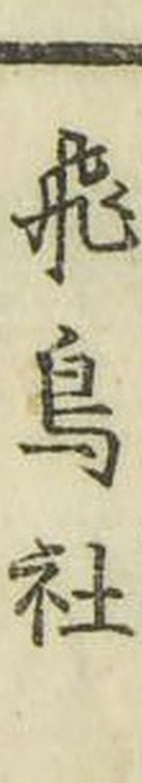飛鳥社
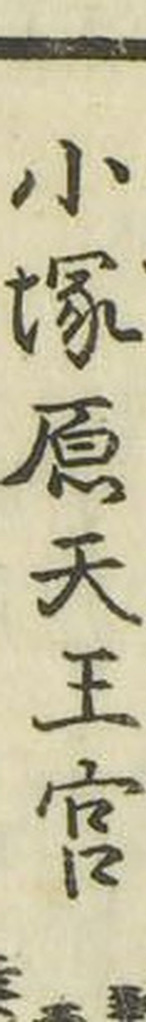小塚原天王宮
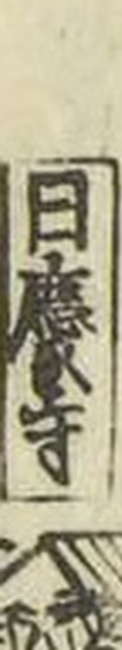日慶寺
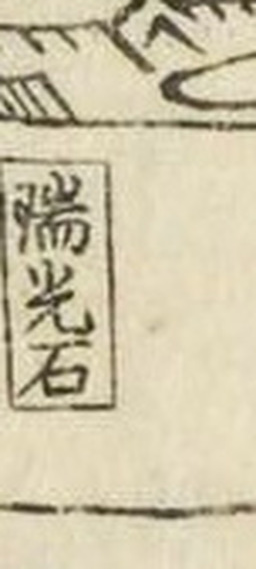瑞光石
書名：江戸名所図会 20巻 巻之17
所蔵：東京学芸大学教育コンテンツアーカイブ
